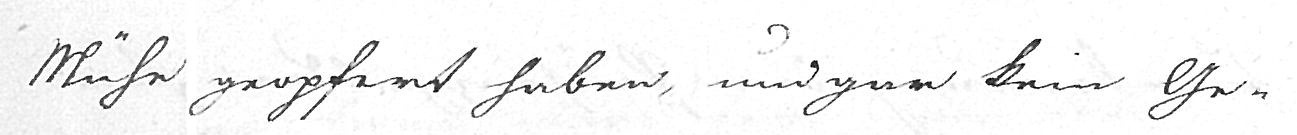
Mühe geopfert haben, und gar kein Ge-
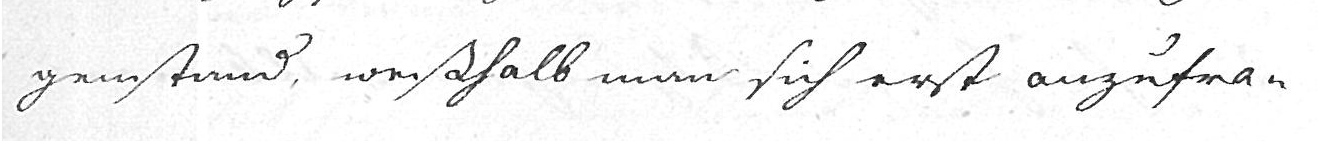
genstand, weßhalb man sich erst anzufra-
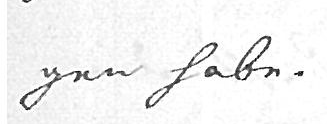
gen habe.
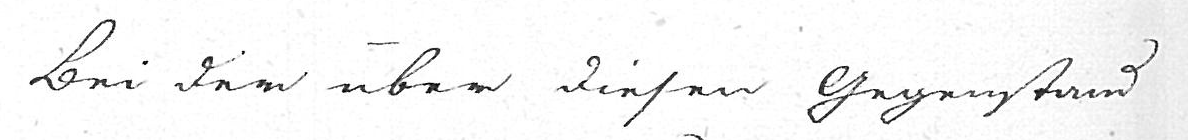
Bei der über diesen Gegenstand
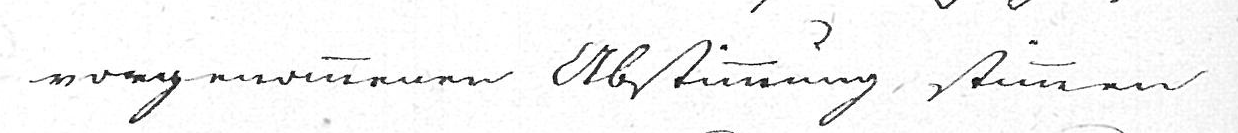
vorgenommenen Abstimmung stimmen
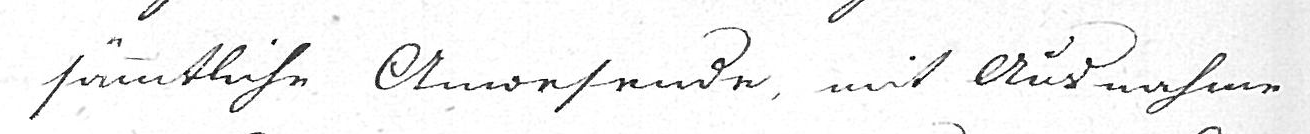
sämmtliche Anwesende, mit Ausnahme
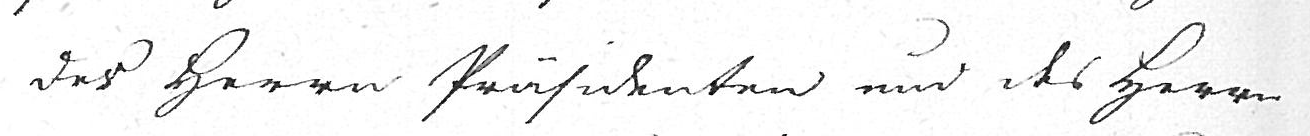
des Herrn Präsidenten und des Herrn
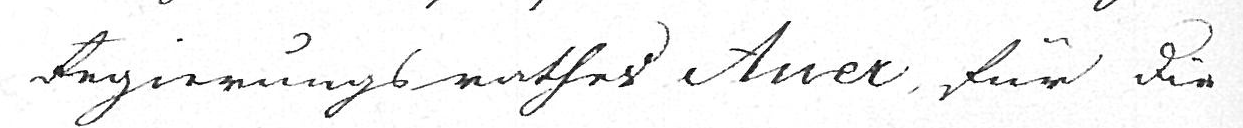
Regierungsrathes Auer, für die
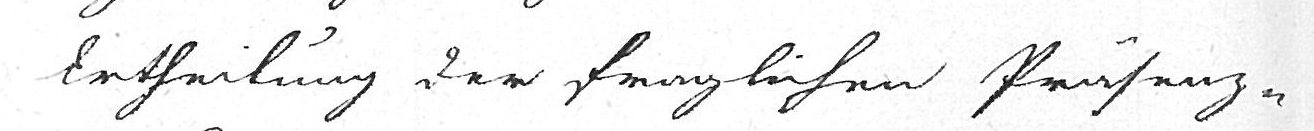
Ertheilung der fraglichen Präsenz-
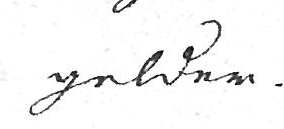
gelder.
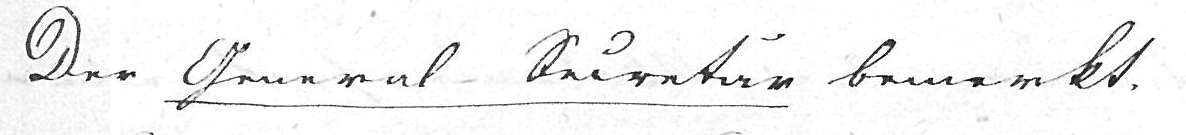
Der General-Secretär bemerkt,
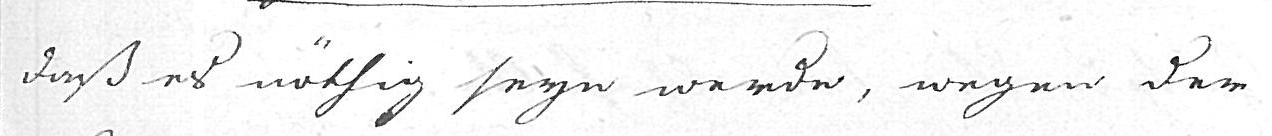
daß es nöthig seyn werde, wegen der
